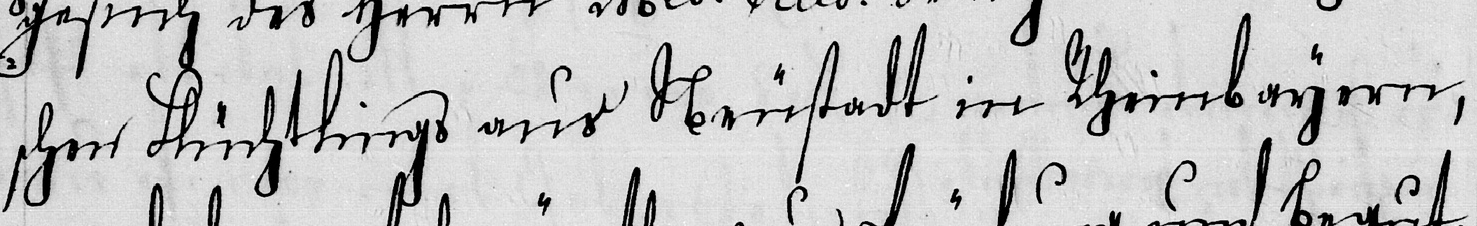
schen Flüchtlings aus Neustadt in Rheinbayern,
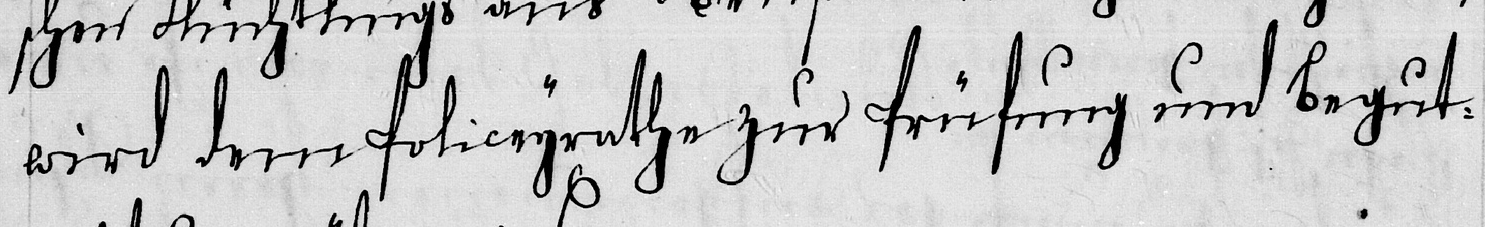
wird dem Policeyrathe zur Prüfung und Begut¬
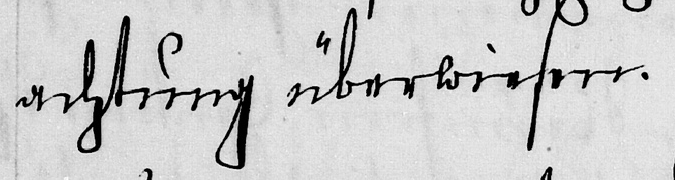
achtung überwiesen.
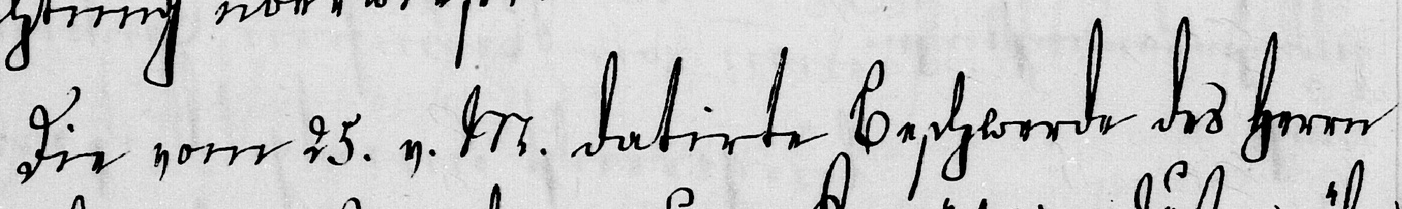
Die vom 25. v. M. datirte Beschwerde des Herrn
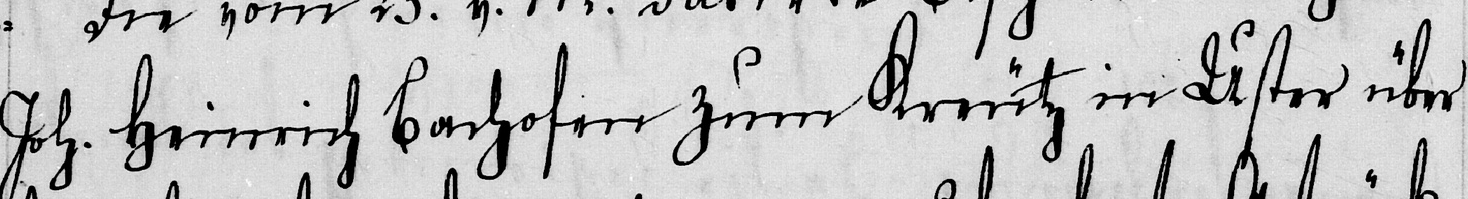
Joh. Heinrich Bachofen zum Kreutz in Uster über
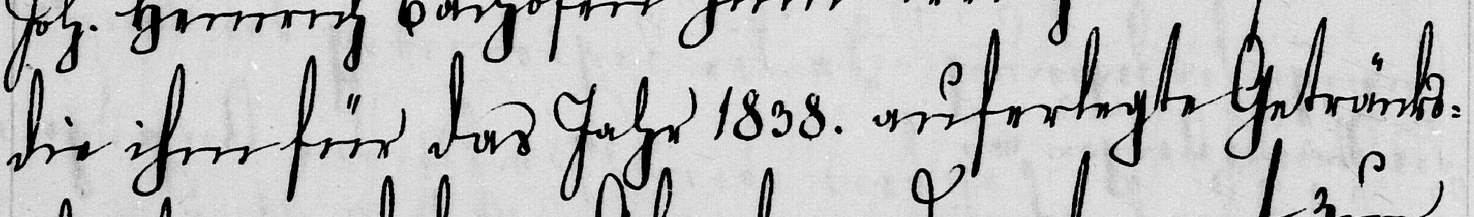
die ihm für das Jahr 1838. auferlegte Getränks¬
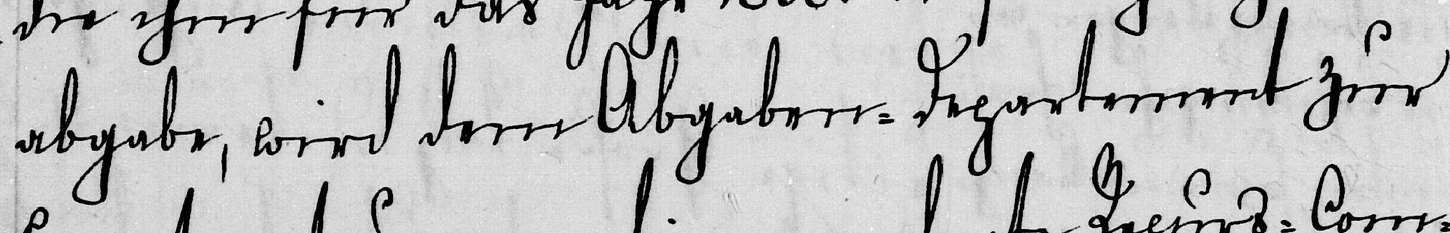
abgabe, wird dem Abgaben-Departement zur
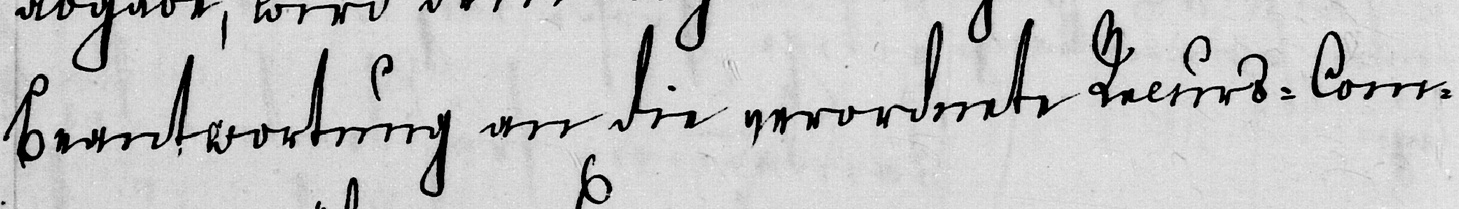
Beantwortung an die verordnete Recurs-Com¬
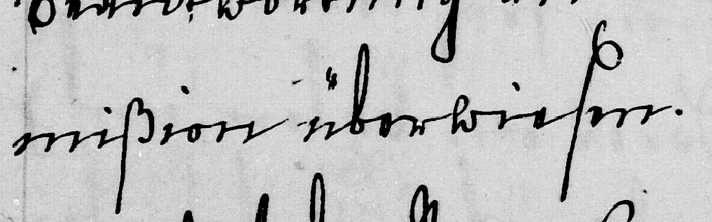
mißion überwiesen.
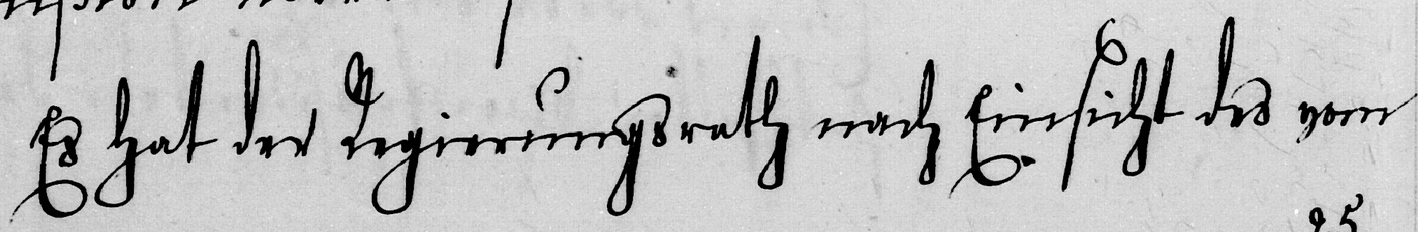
Es hat der Regierungsrath nach Einsicht des vom
